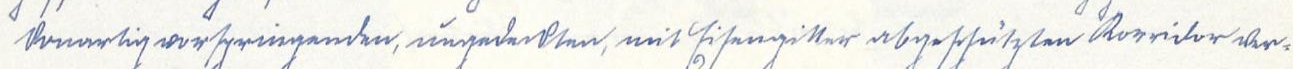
konartig vorspringenden, ungedeckten, mit Eisengitter abgeschützten Korridor ver
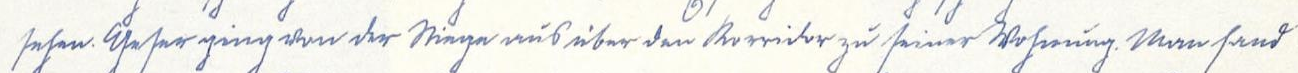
sehen. Geser ging von der Stiege aus über den Korridor zu seiner Wohnung. Man fand
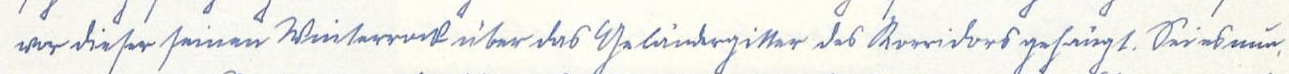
vor dieser seinen Winterrock über das Geländergitter des Korridors gehängt. Se es nun
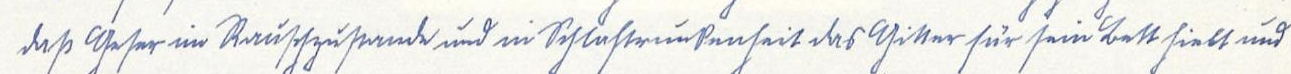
daß Geser in seinem Rauschzustande und in Schlaftrunkenheit das Gitter für sein Bett hielt und
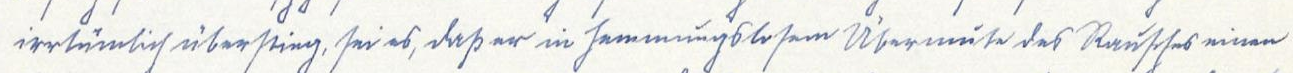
irrtümlich überstieg, sei es, daß er in hemmungslosem Übermut des Rausches einen
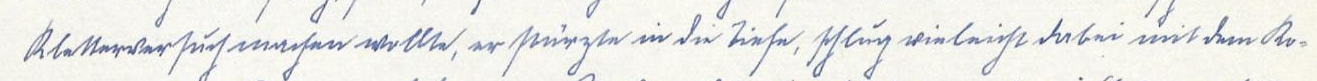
Kletterversuch machen wollte, er stürzte in die Tiefe, schlug vielleicht dabei mit dem Ko-
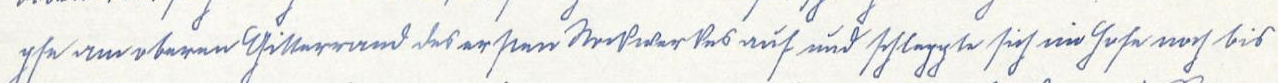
pfe am unteren Gitterrand des ersten Stockwerkes auf und schleppte sich im Hofe noch bis
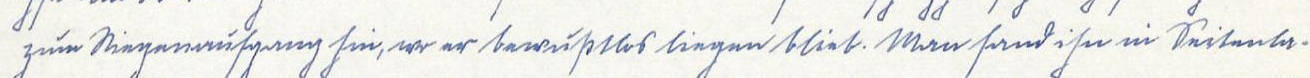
zum Stiegenaufgang hin, wo er bewusstlos liegen blieb. Man fand ihn in Seitenla-
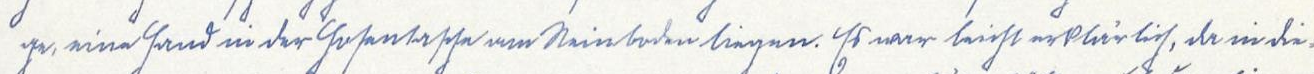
ge, eine Hand in der Hosentasche am Steinboden liegen. Es war leicht erklärlich, da in die-
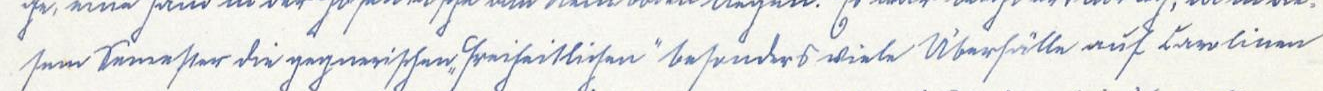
sem Semester die gegnerischen „Freiheitlichen“ besonders viele Überfälle auf Carolinen
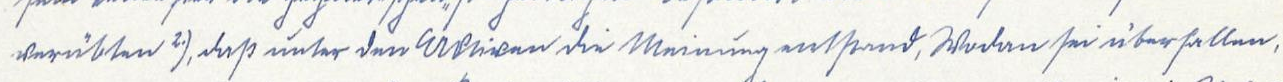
verübten 2), daß unter den Aktiven die Meinung entstand, Wodan sei überfallen,
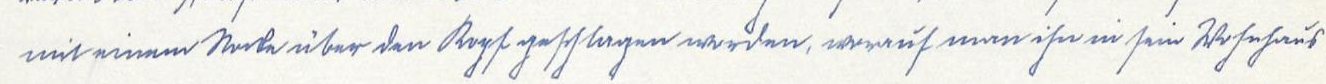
mit einem Stock über den Kopf geschlagen worden, worauf man ihn in sein Wohnhaus
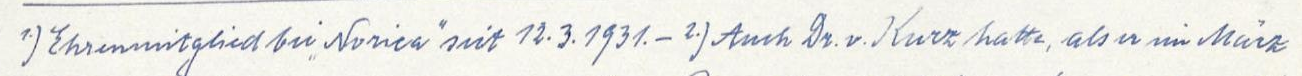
1) Ehrenmitglied bei Norica 12.3.1931.- 2) Auch Dr. v Kurz hatte, als im März
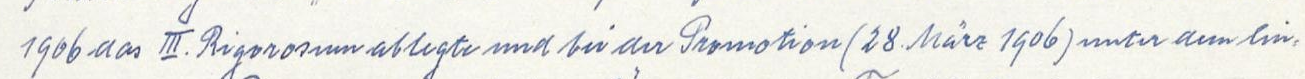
1906 das III. Rigorosum ablegte und bei der Promotion (28. März 1906) und dem lin-
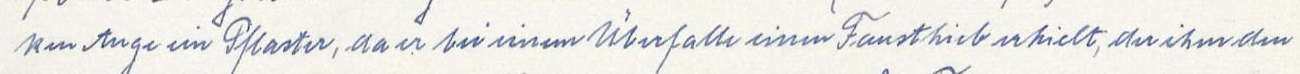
ken Auge ein Pflaster, das er beim Überfalle einen Fausthieb erhielt, der in ihm den
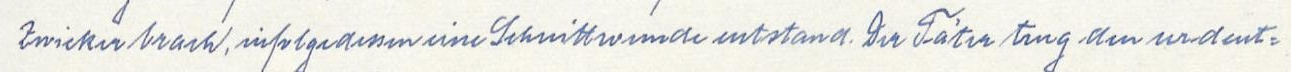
Zwicker brach, infolgedessen eine Schnittwunde entstand. Der Täter trug den urdeut-
